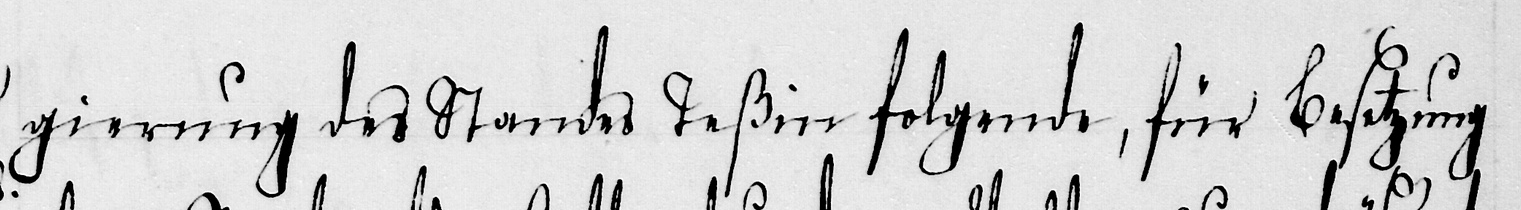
gierung des Standes Teßin folgende, für Besetzung
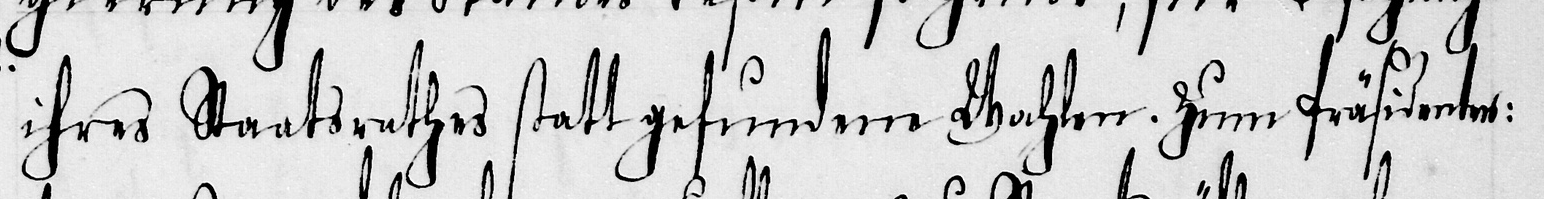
ihres Staatsrathes statt gefundene Wahlen. Zum Präsidente¬
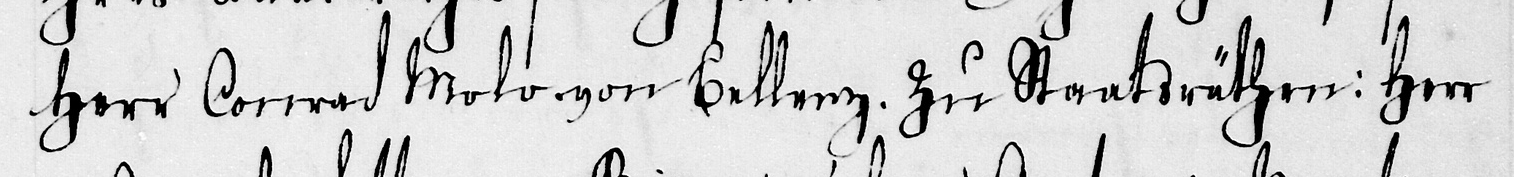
Herr Conrad Molo von Bellenz. Zu Staatsräthen: Herr
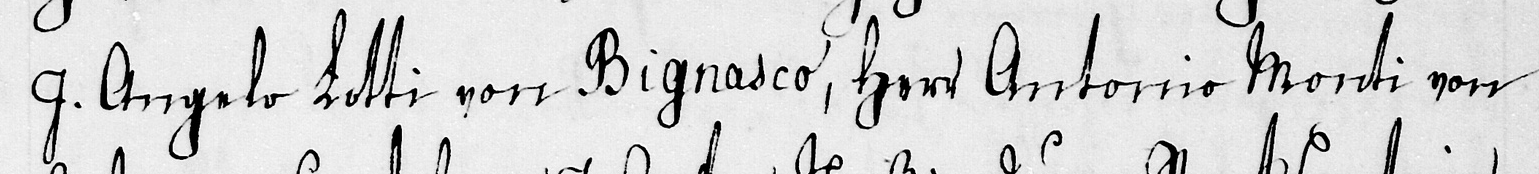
J. Angelo Lotti von Bignasco, Herr Antonio Monti von
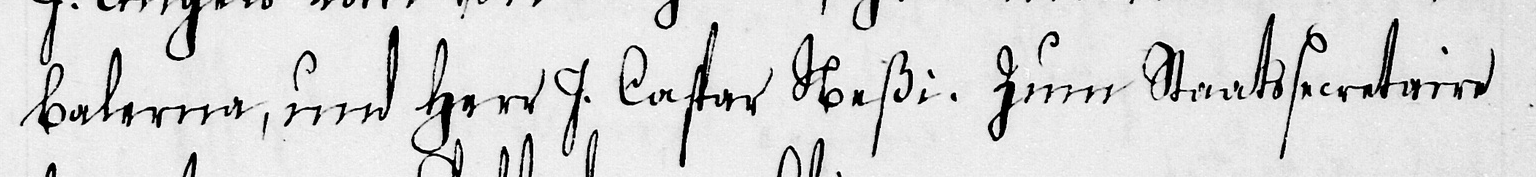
Balerna, und Herr J. Caspar Neßi. Zum Staatssecretaire
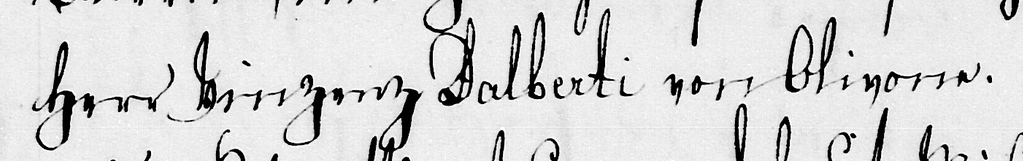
Herr Vinzenz Dalberti von Olivone.
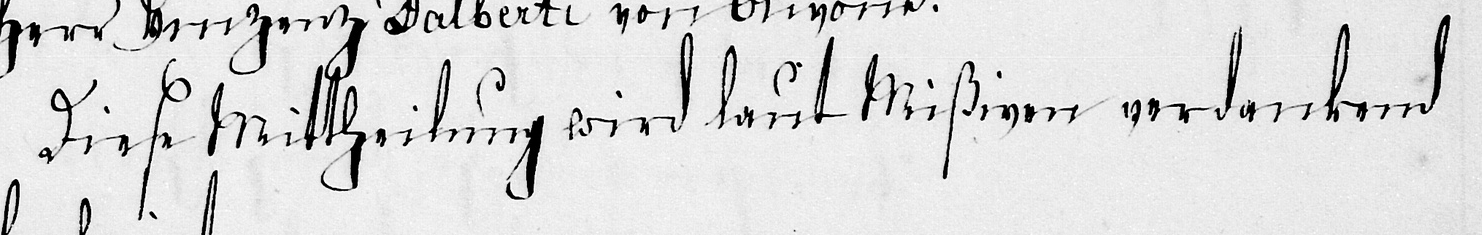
Diese Mittheilung wird laut Mißiven verdankend
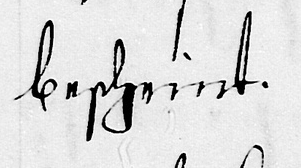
bescheint.
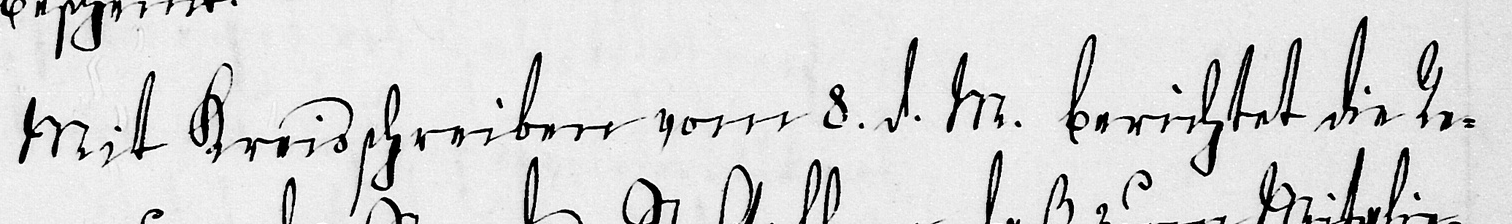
Mit Kreisschreiben vom 8. d. M. berichtet die Re¬
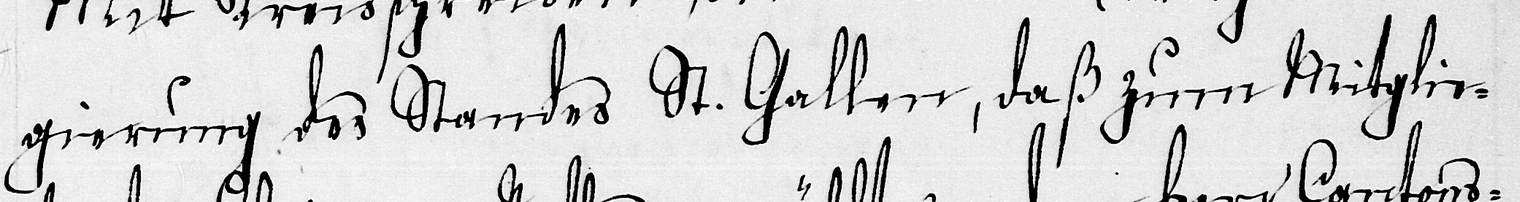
gierung des Standes St. Gallen, daß zum Mitglie¬
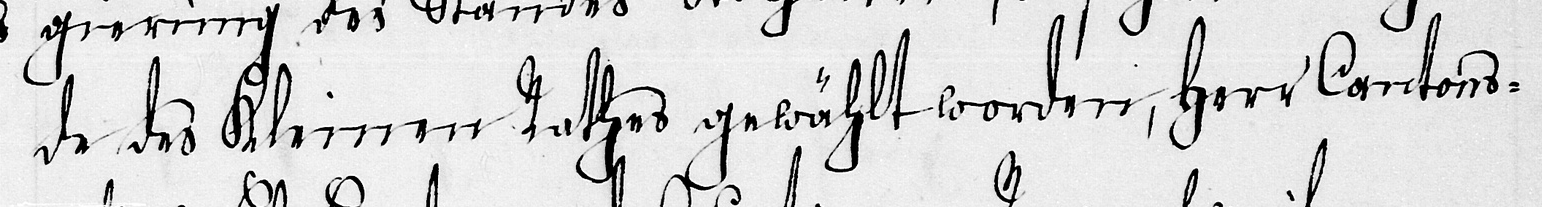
de des Kleinen Rathes gewählt worden, Herr Cantons¬
